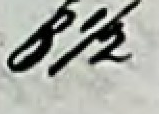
8 1/2
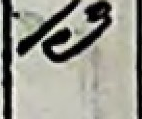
13
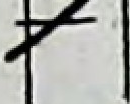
7
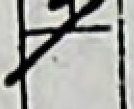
7
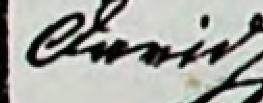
David
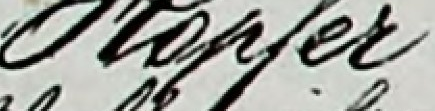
Hopfer
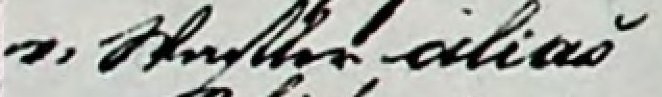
v. Wastter alias
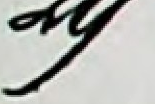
29
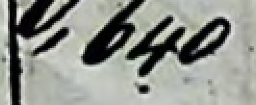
0,640
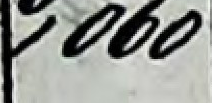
0,060
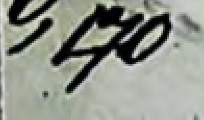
0,170
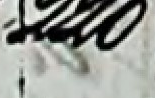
220
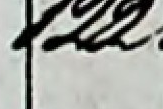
122
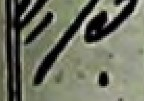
3,75
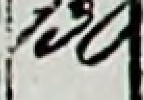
130
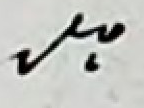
Do
